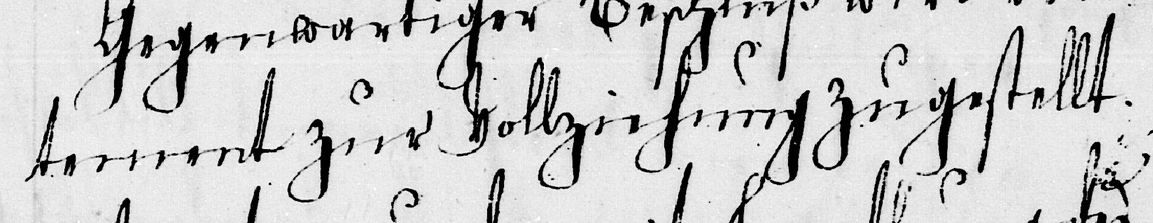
tement zur Vollziehung zugestellt.
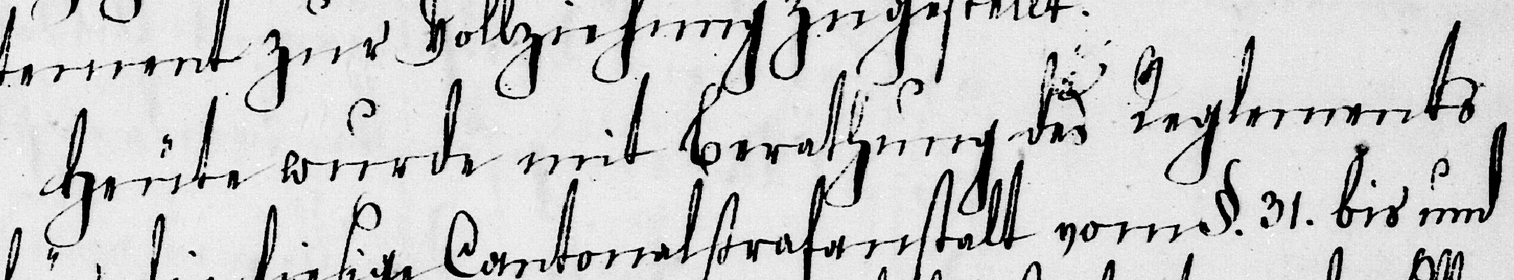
Heute wurde mit Berathung des Reglements
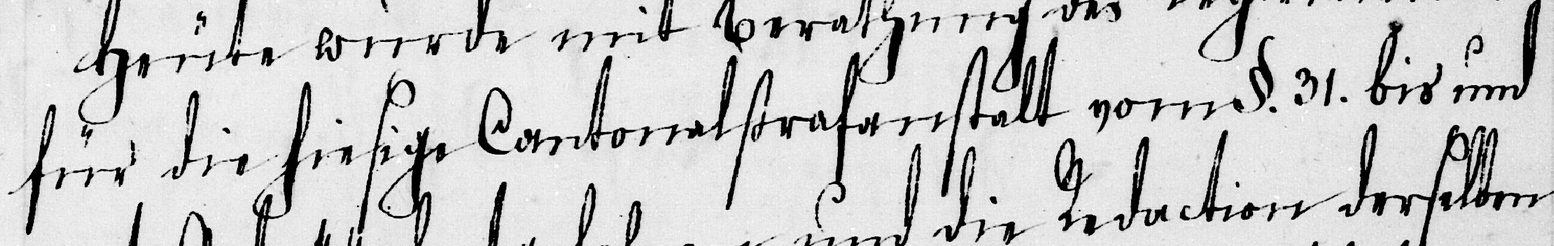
für die hiesige Cantonalstrafanstalt vom §. 31. bis und
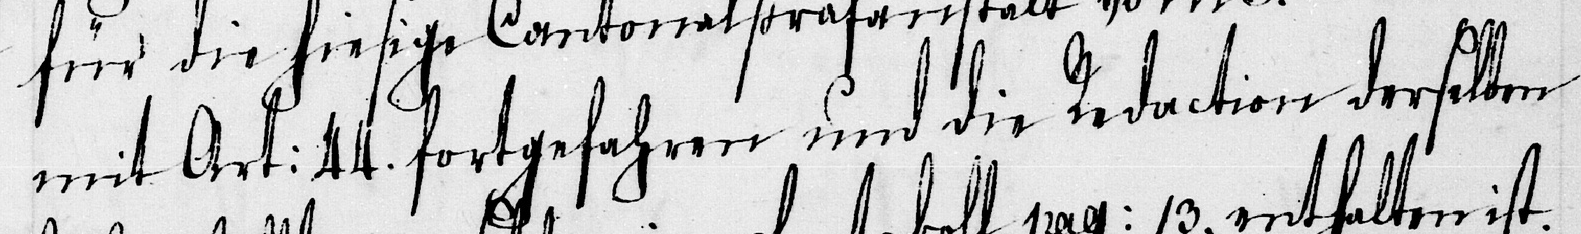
mit Art: 44 fortgefahren und die Redaction derselben
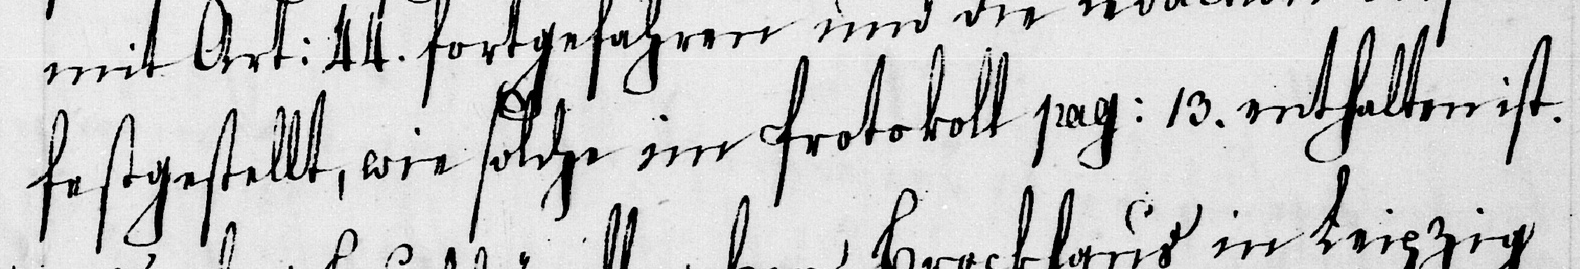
festgestellt, wie solche im Protokoll pag: 13. enthalten is¬
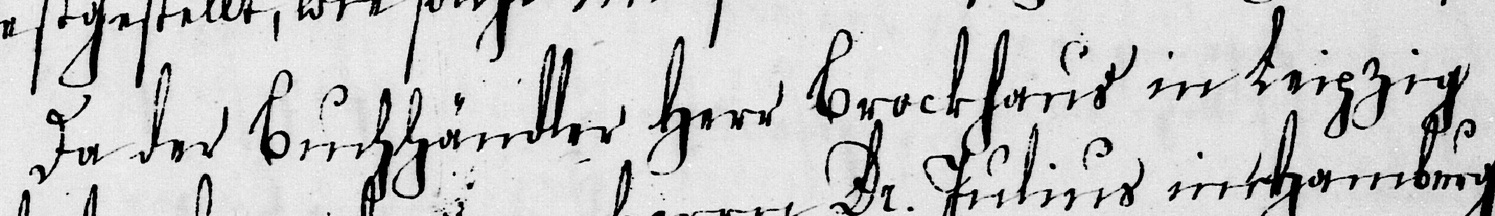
Da der Buchhändler Herr Brockhaus in Leipzig
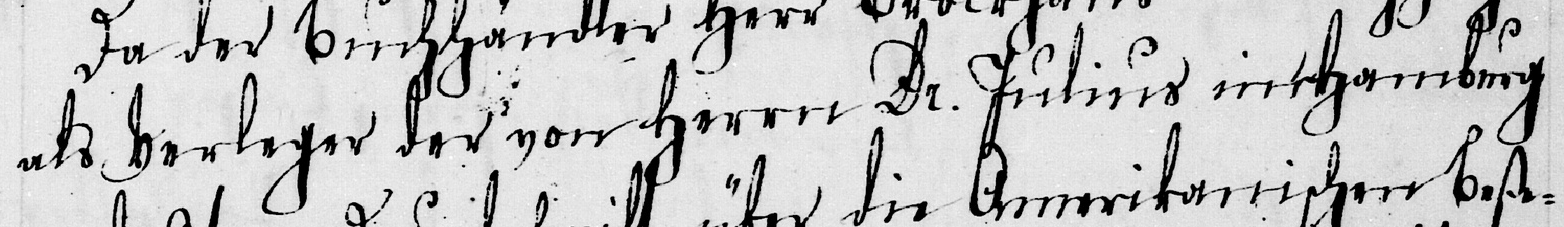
als Verleger der von Herrn Dr. Julius in Hamburg
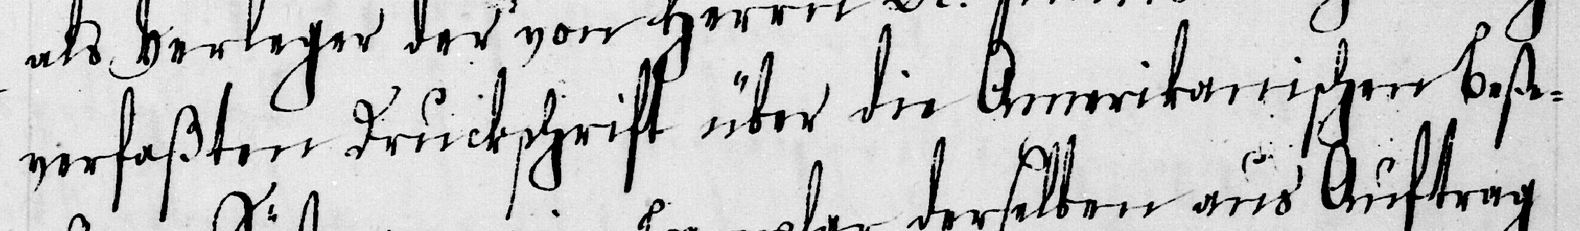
verfaßten Druckschrift über die Amerikanischen Beß¬
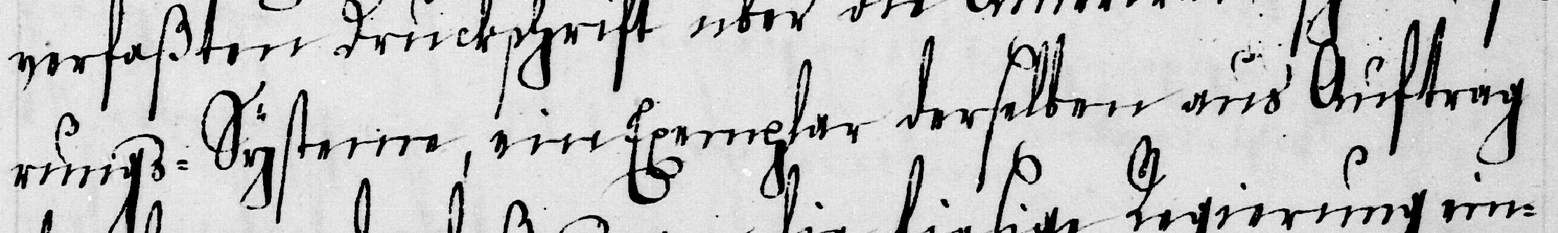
erungs-Systeme, ein Exemplar derselben aus Auftrag
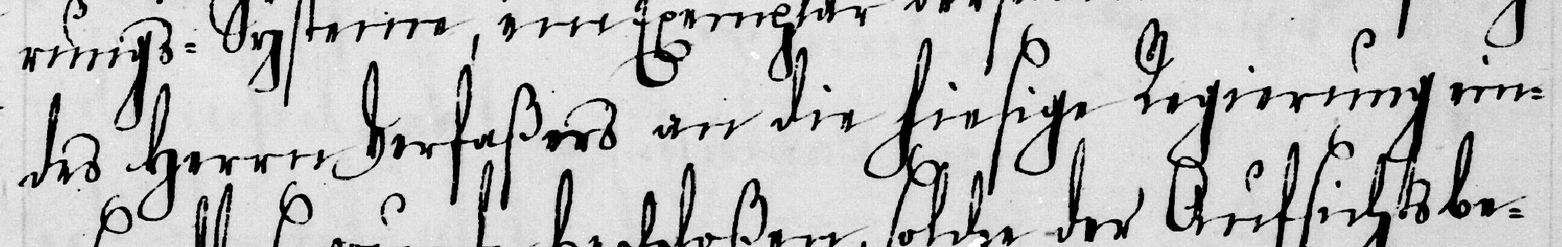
des Herrn Verfaßers an die hiesige Regierung ein¬
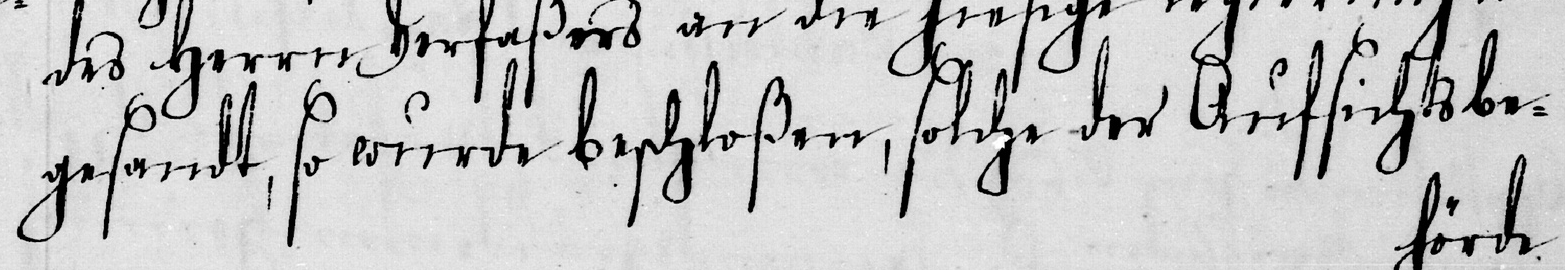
gesandt, so wurde beschloßen, solche der Aufsichtsbe-
